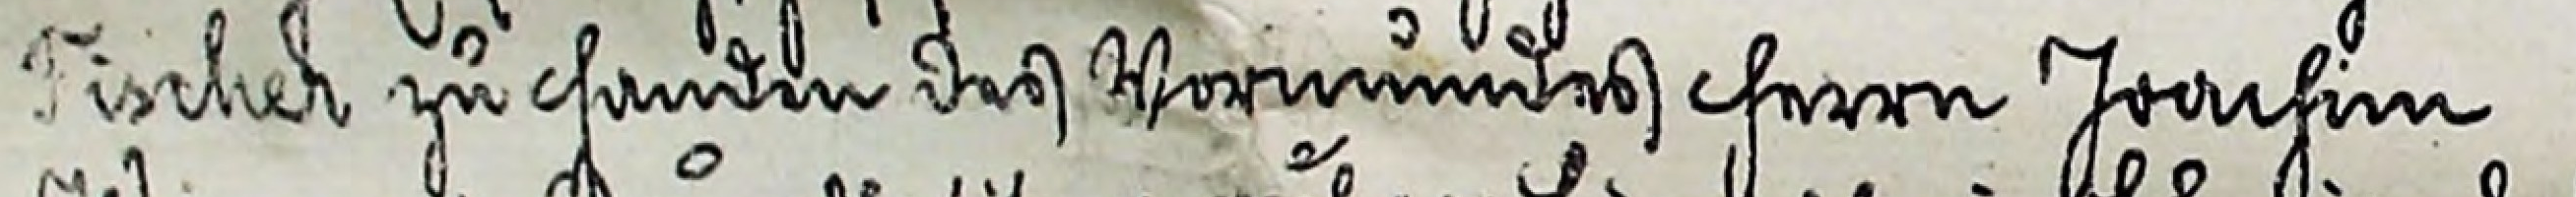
Fischer zu Handen des Vormundes Herrn Joachim
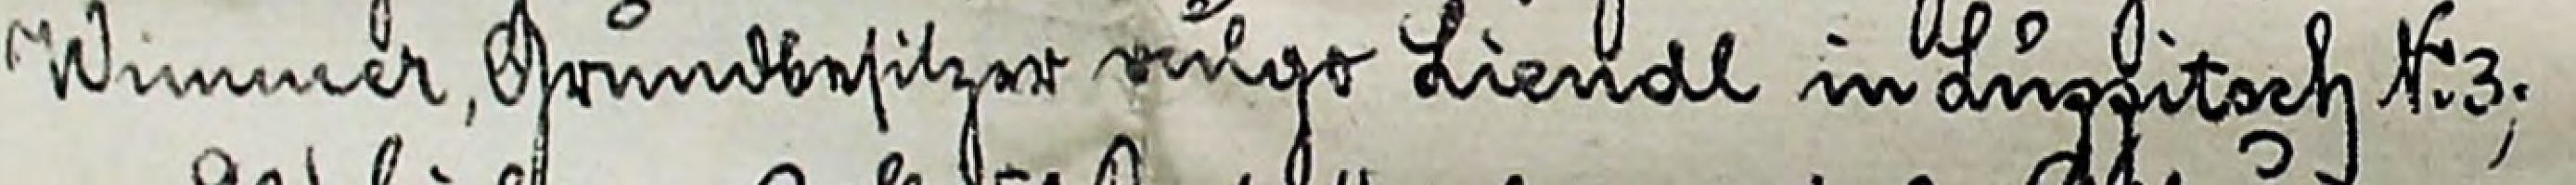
Wimmer, Grundbesitzer vulgo Liendl in Luppitsch № 3;
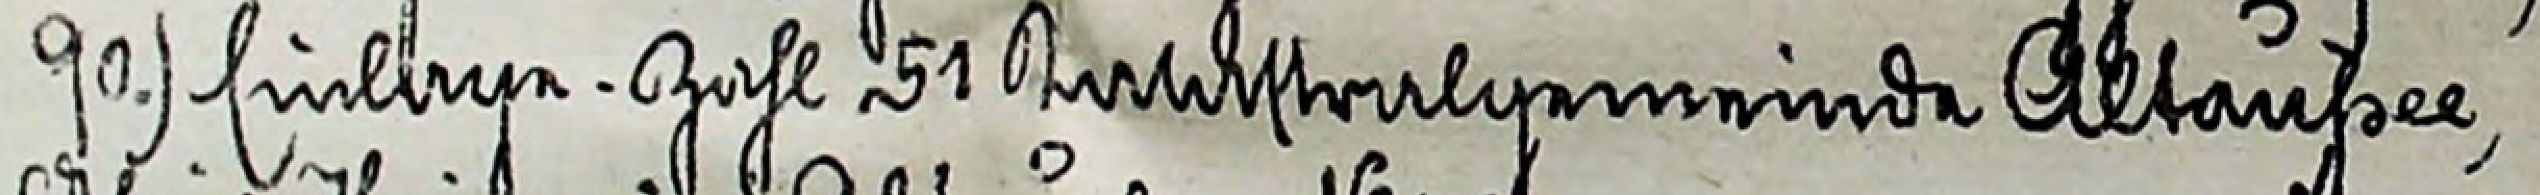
90.) Einlage - Zahl 51 Katastralgemeinde Altaussee,
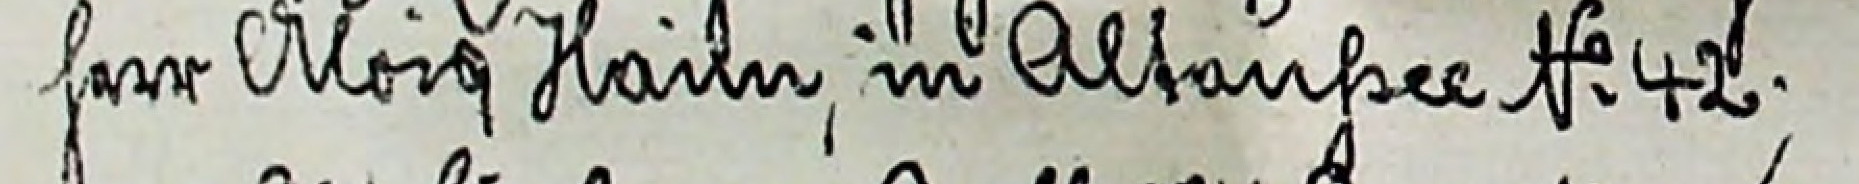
Herr Alois Haim, in Altaussee № 42;
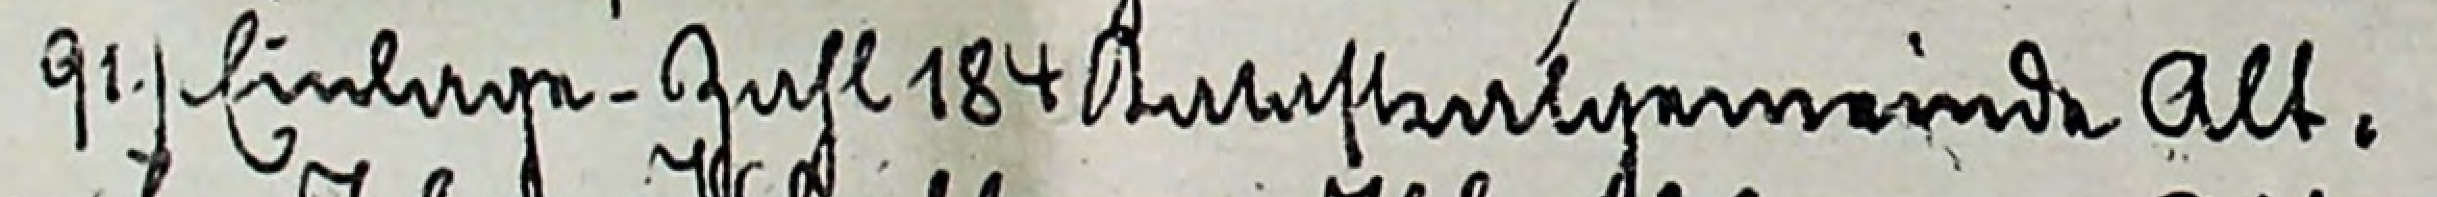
91.) Einlage - Zahl 184 Katastralgemeinde Alt=
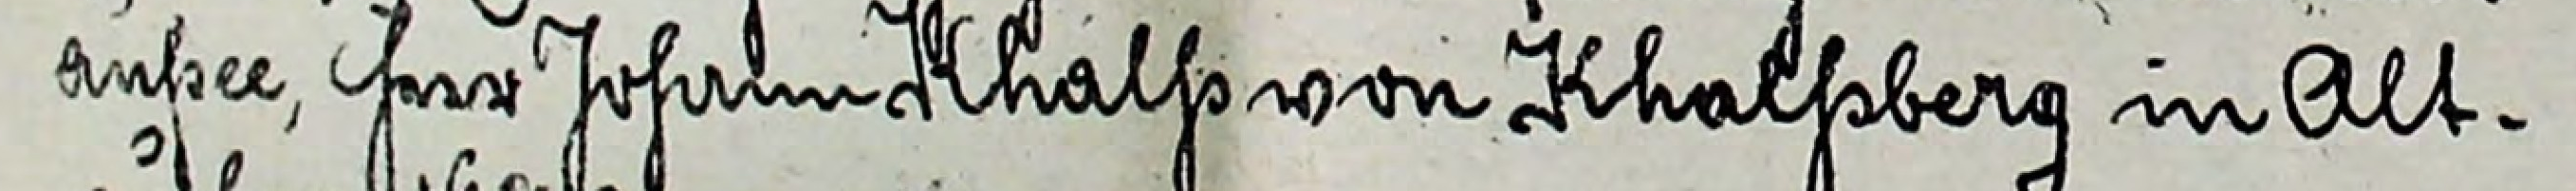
aussee, Herr Johann Khalhs von Khalhsberg in Alt=
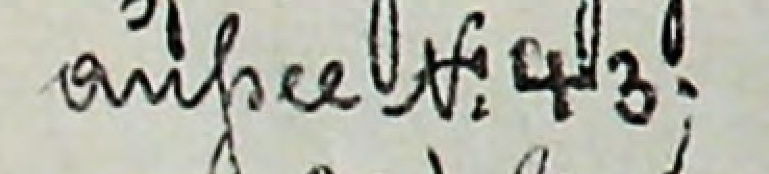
aussee № 43;
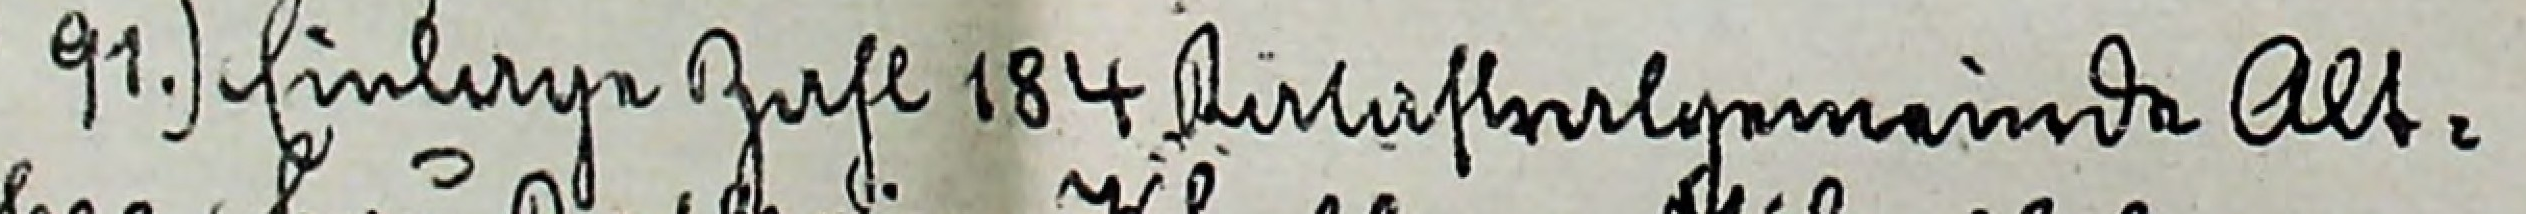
91.) Einlage - Zahl 184 Katastralgemeinde Alt=
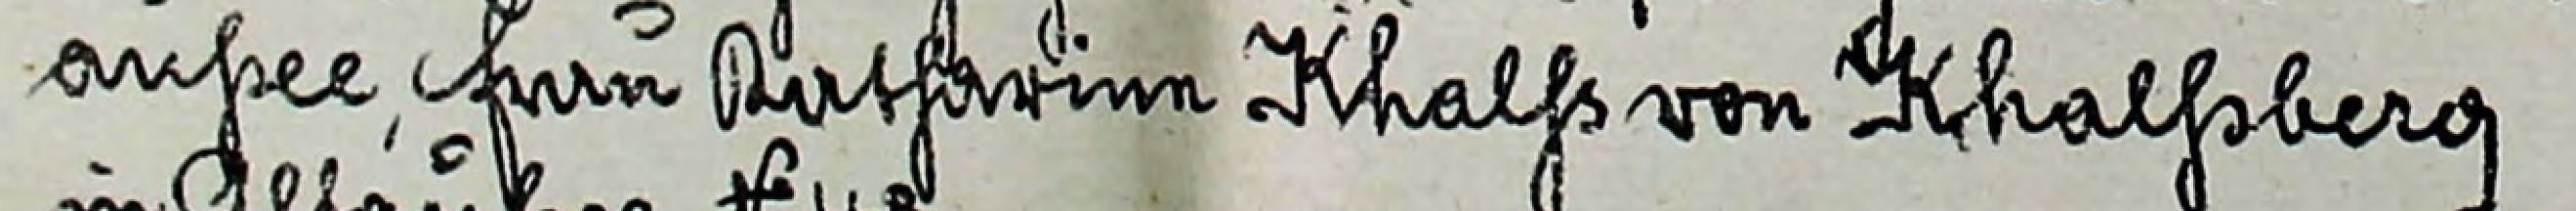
aussee, Frau Katharine Khalhs von Khalhsberg
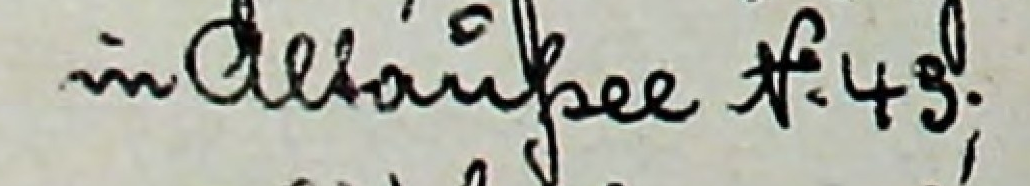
in Altaussee № 43;
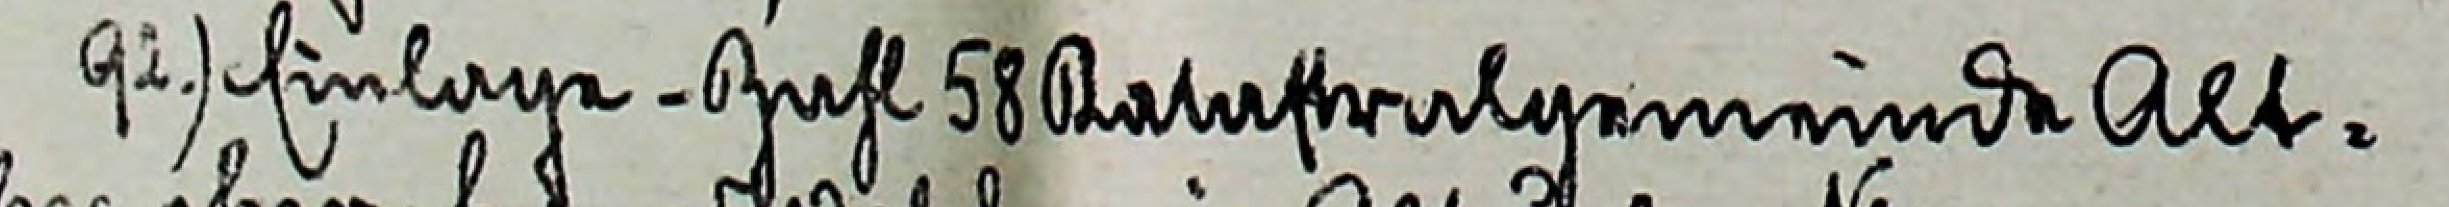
92.) Einlage - Zahl 58 Katastralgemeinde Alt=
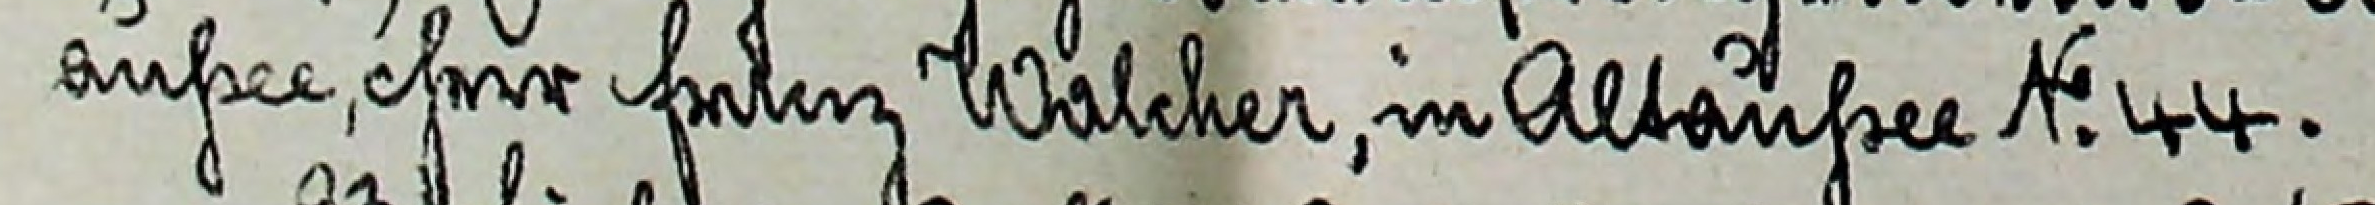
aussee, Herr Franz Walcher, in Altaussee № 44;
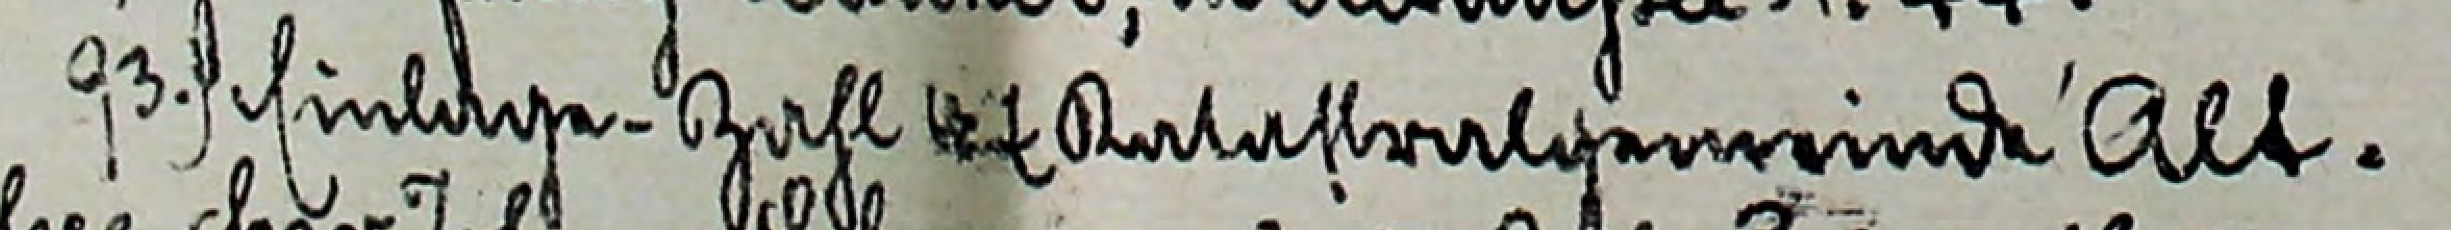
93.) Einlage - Zahl 47 Katastralgemeinde Alt=
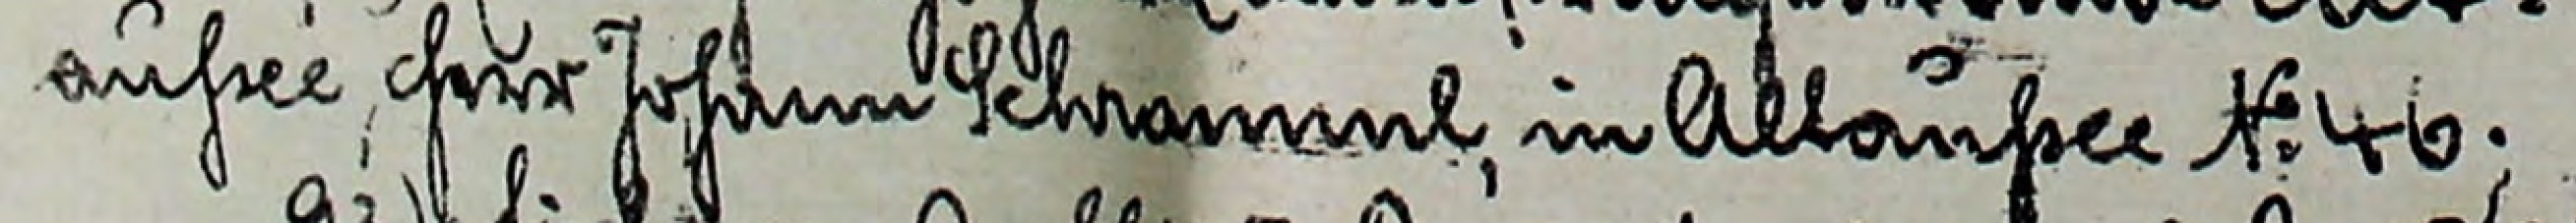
aussee, Herr Johann Schramml, in Altaussee № 46;
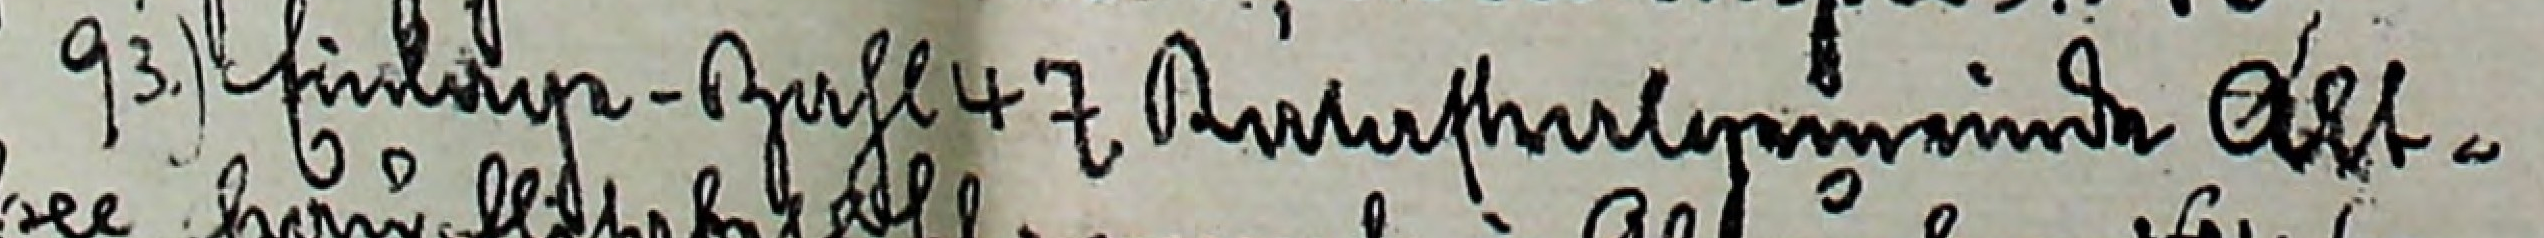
93.) Einlage - Zahl 47 Katastralgemeinde Alt=
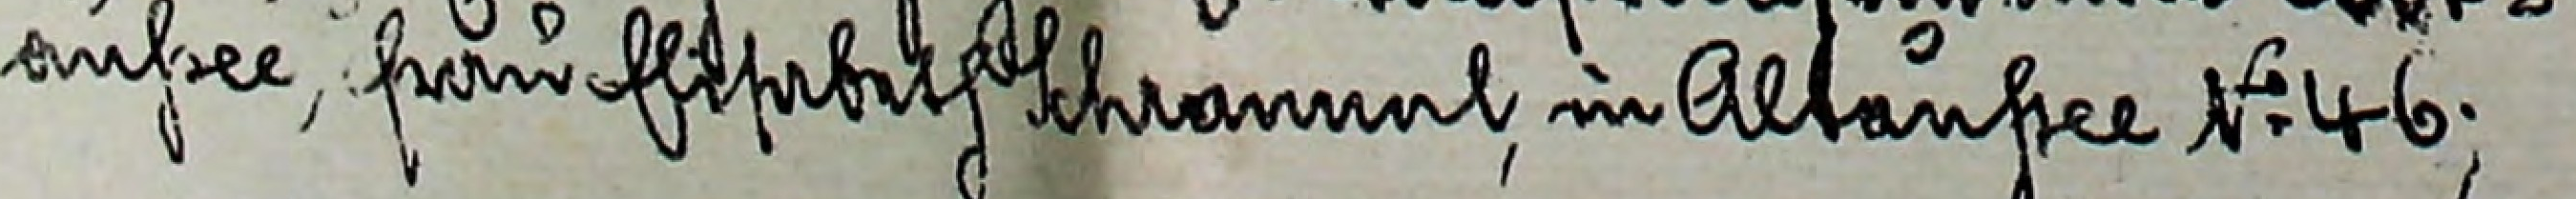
aussee, Frau Elisabeth Schramml, in Altaussee № 46;
